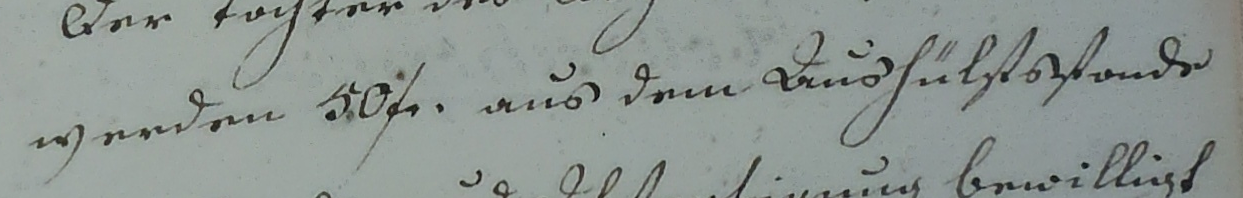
werden 50fr. aus dem Aushülfsfonde
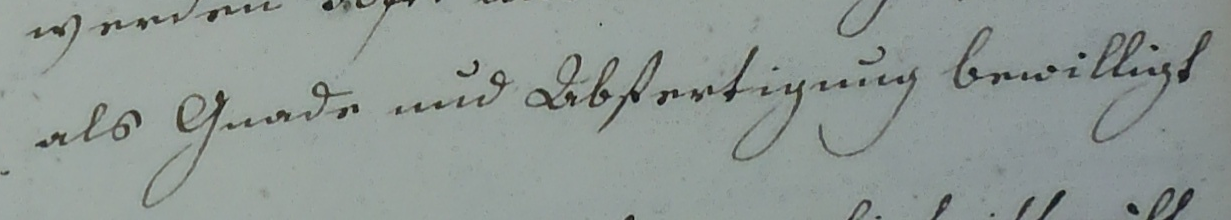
als Gnade und Abfertigung bewilligt
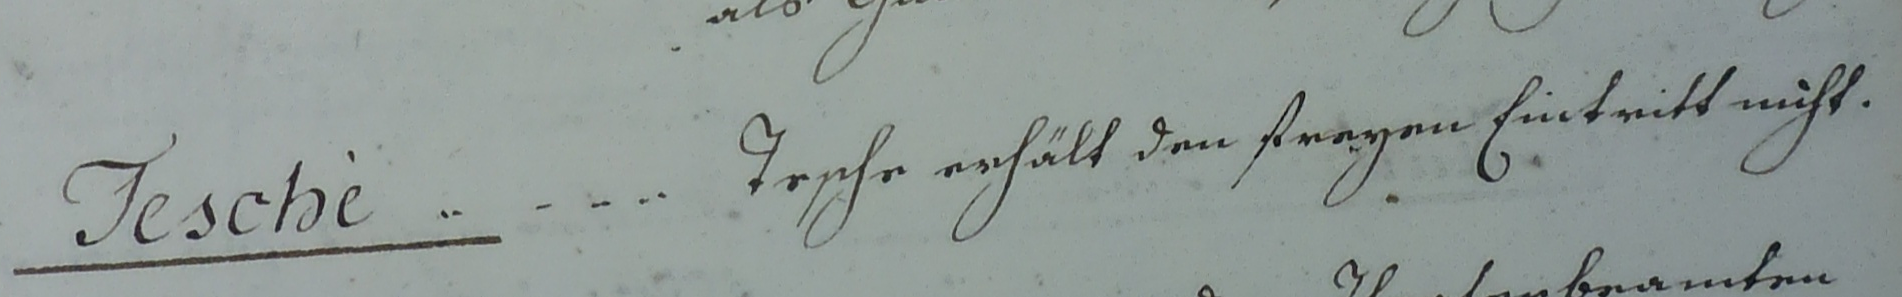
Tesche .. .. .. .. Tesche erhält den freyen Eintritt nicht.
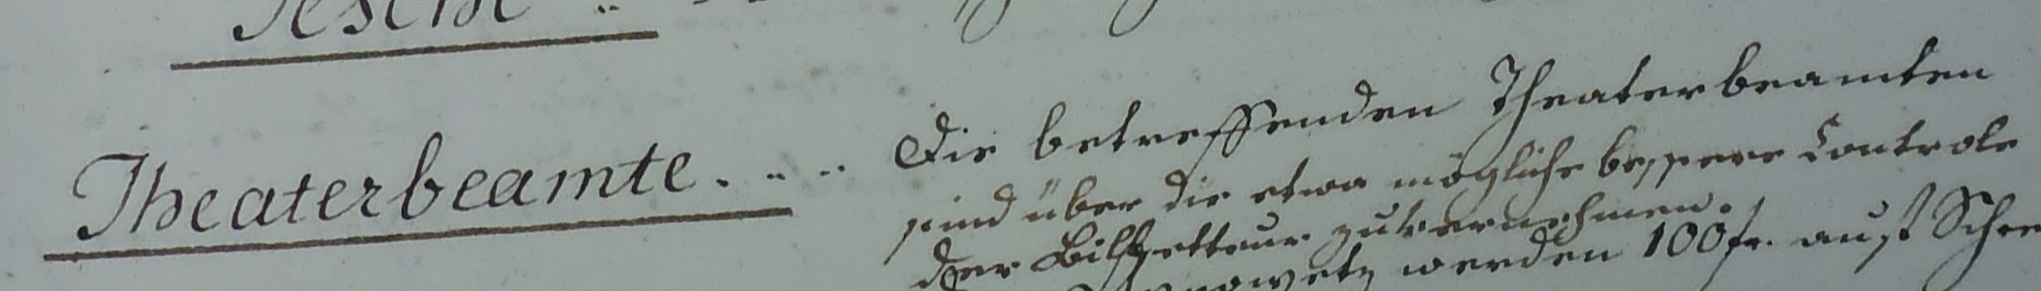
Theaterbeamte . .. : Die betreffenden Theaterbeamten
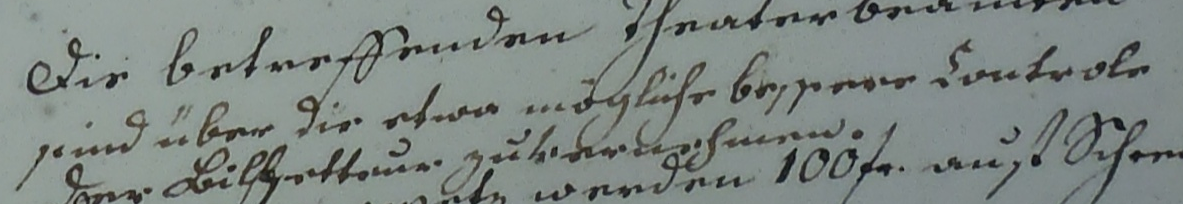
sind über die etwa mögliche bessere Controle
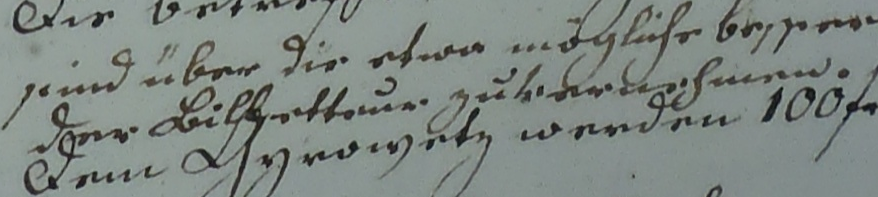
der Billetteur zuvernehmen.
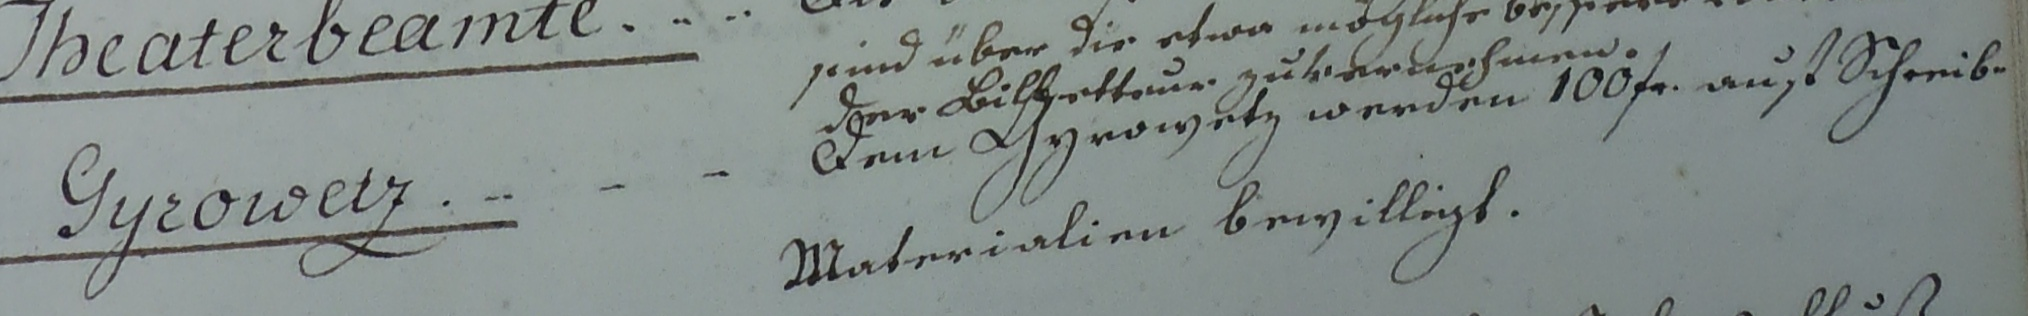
Gyrowetz. .. .. .. Dem Gyrowetz werden 100fr. auf Schreib¬
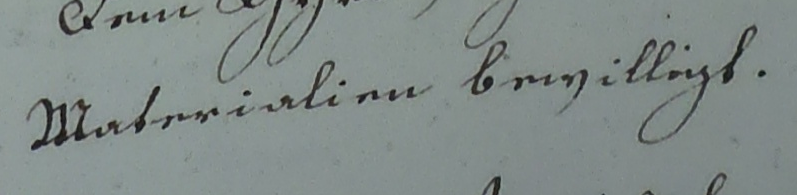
Materialien bewilligt.
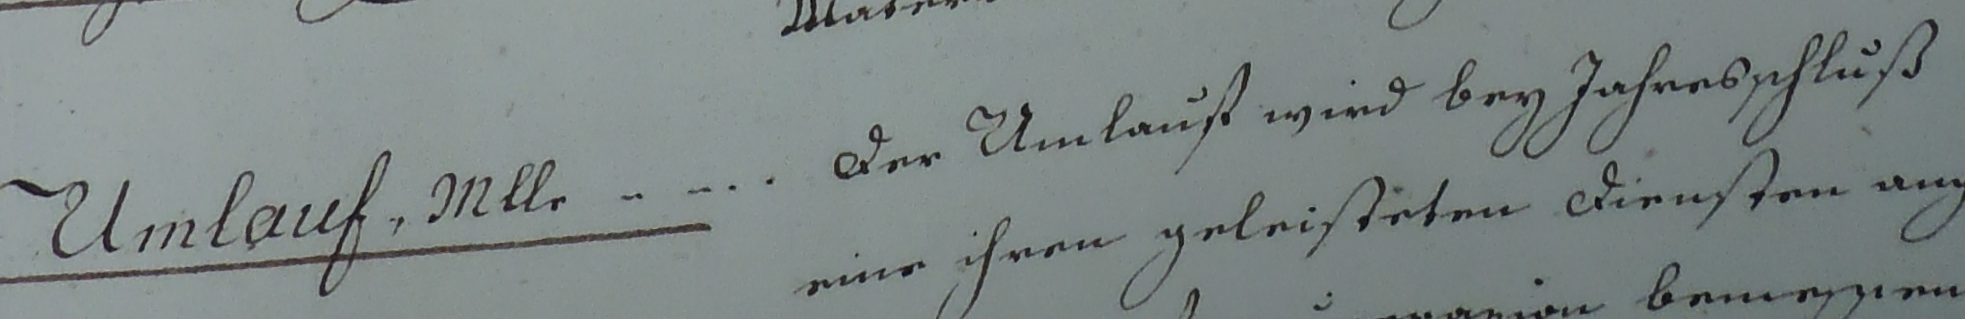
Umlauf, Mlle. .. .. . . Der Umlauf wird bey Jahresschluß
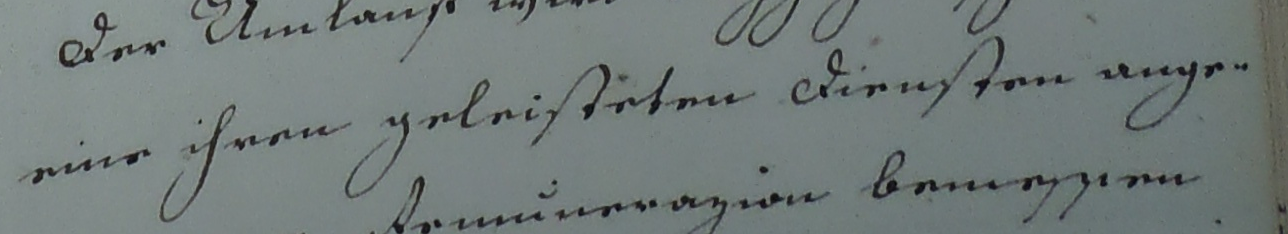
eine ihren geleisteten Diensten ange¬
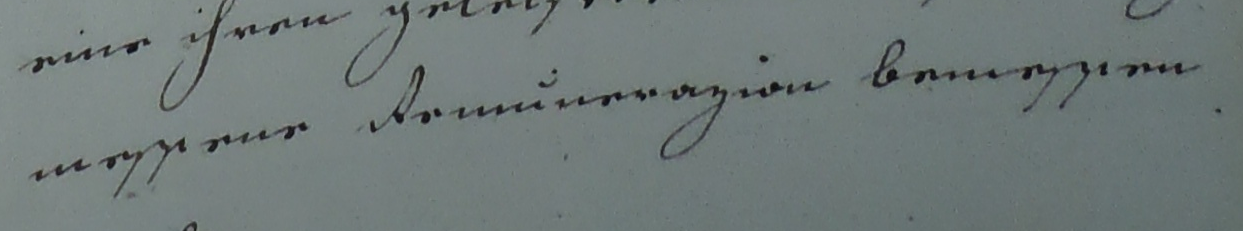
messene Remunerzion bemessen
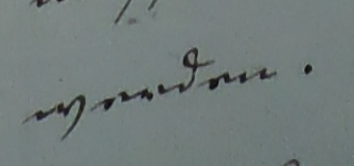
wetden.
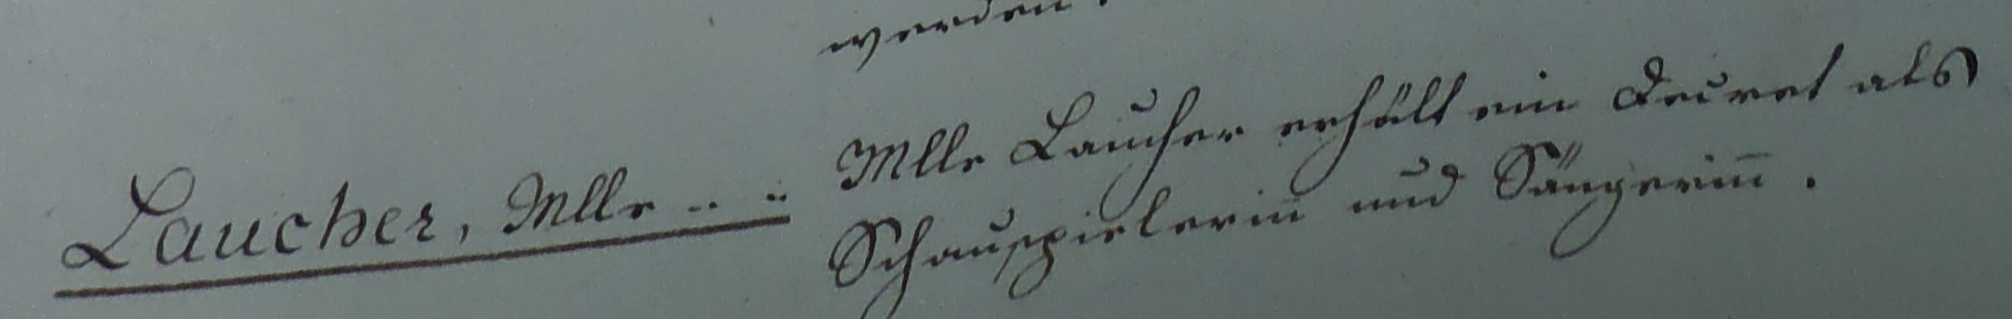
Laucher, Mlle .. .. Mlle Laucher erhält ein Decret als
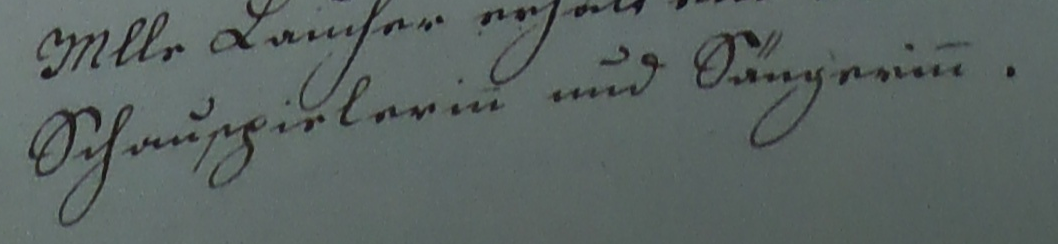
Schauspielerin und Sängerin̅.
